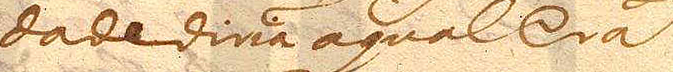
dade diria a qual era
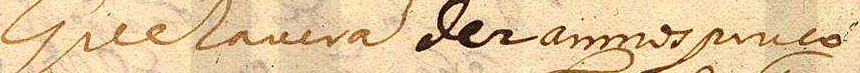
Que hauera dez annos pouco
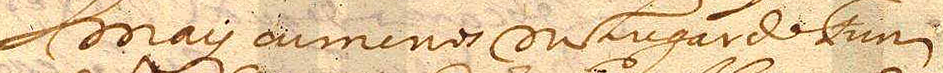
mais ou menos no Lugar do Fun
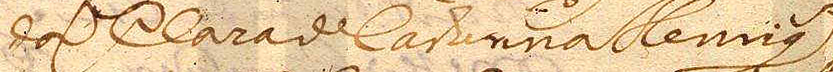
dā e caza de Catherina Henriqs
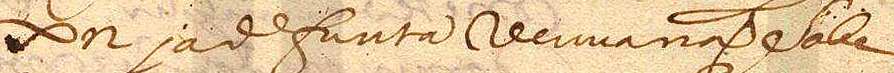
xn ja defunta veuua nā Sabe
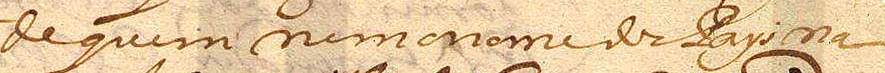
de quem nem o nome dos Pays na
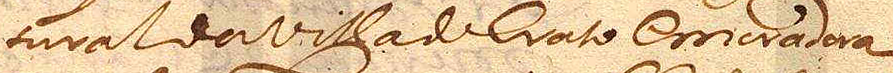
tural da villa do Crato e moradora
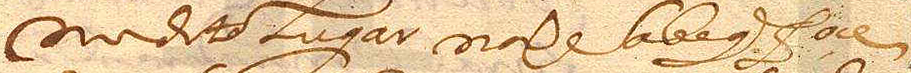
no dito Lugar nā Sabe q̄ foçe
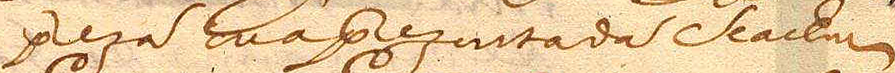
preza ou aprezentada Se achou
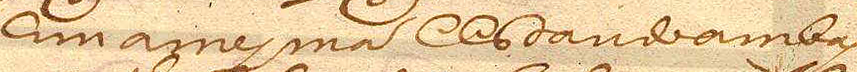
com a mesma e estando ambas
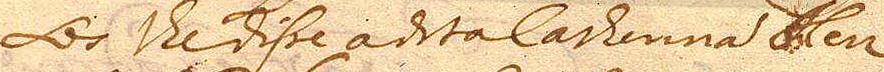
sos lhe disse a dita Catherina Hen
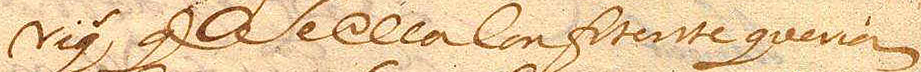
riqs q̄ Se ella Confitente queria
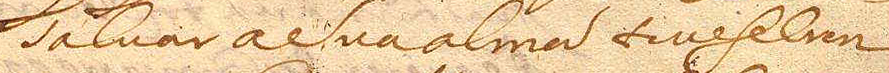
saluar a Sua alma tiuese cren
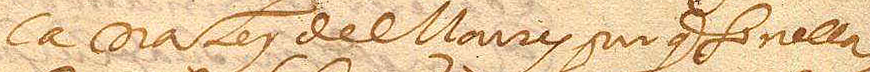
ca na Ley de Moizes porq̄ so nella
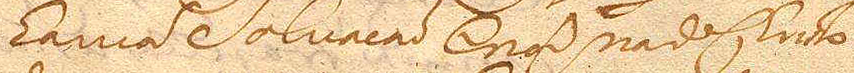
hauia Saluacaõ E nā na do Christo
